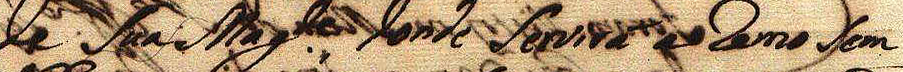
de sua Mag.de donde servirá a Remo sem
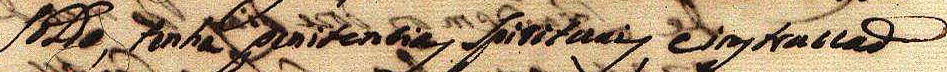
Soldo, tenha penitencias spirituais, e instruccaõ
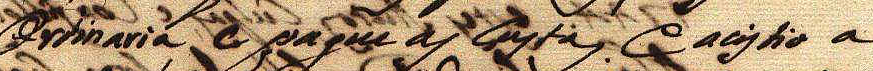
Ordinaria, e pague as custas e asistio a
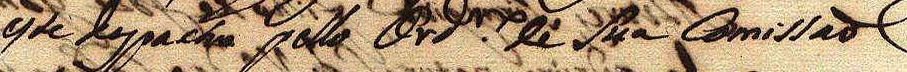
este despacho pello Ord.ro de sua Comissaõ
